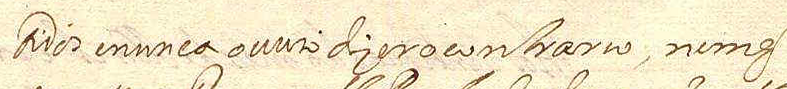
tidos e nunca ouuio dizer o contrario, nem q̄
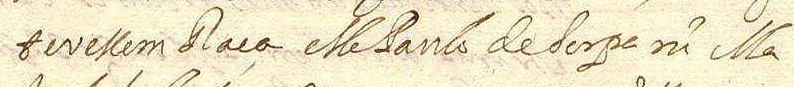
tevessem Raça elle Paulo de Serpa nē ella
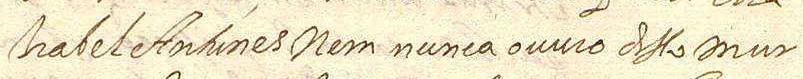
Izabel Antunes nem nunca ouuio disso mur
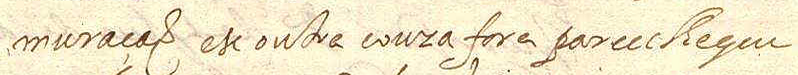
muraçaõ e se outra couza fora parecelhe que
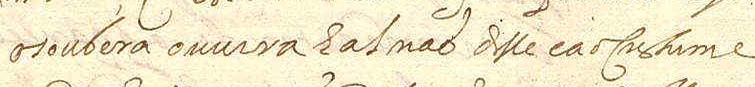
o soubera ouuira E al naõ disse e ao Custume
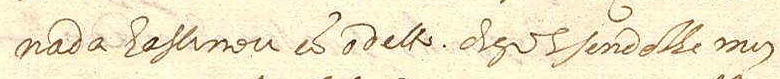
nada E assinou cō o ditto digo E sendolhe mos
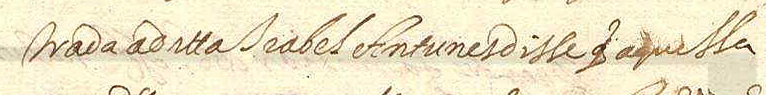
trada a ditta Izabel Antunes disse q̄ aquella
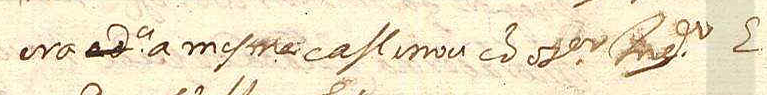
era a d.a a mesma e assinou cō o sor. Inq.or E
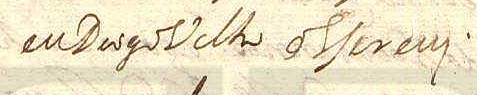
eu Diogo Velho o Escreuj.
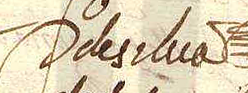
Po de silua
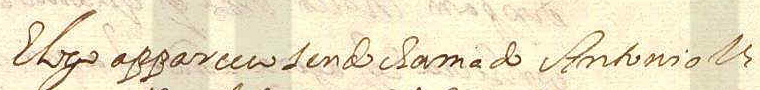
E logo appareceo sendo chamado Antonio Vi
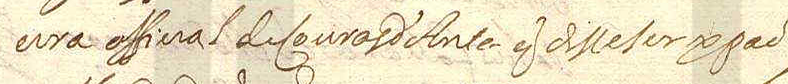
eira official de Couros d'Anta q̄ disse ser xpaõ
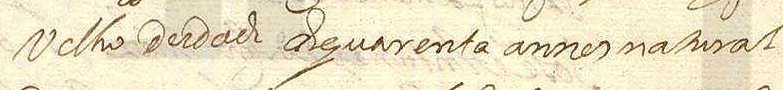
Velho de idade de quarenta annos natural
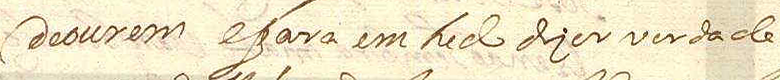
de ourem e para em tudo dizer verdade
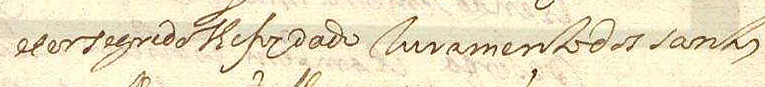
e ter segredo lhe foj dado Iuramento dos santos
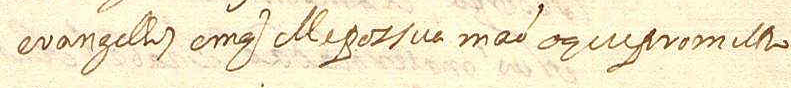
evangelhos em q̄ elle pos sua maõ o que prometteo
